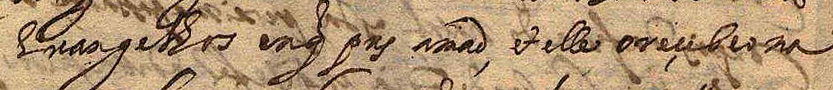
Euangelhos en q̄ pus a maõ, & elle o recebeo na
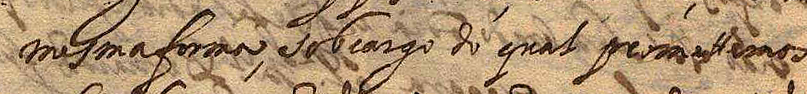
mesma forma, sob cargo do qual promettemos
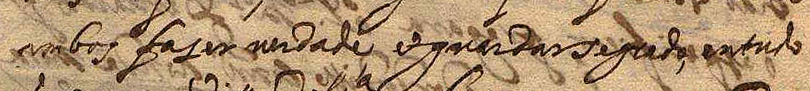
ambos fazer uerdade & guardar segredo, en tudo
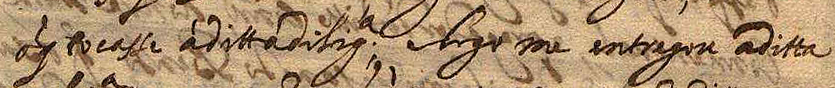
o q̄ tocasse à ditta diliga; e logo me entregou a ditta
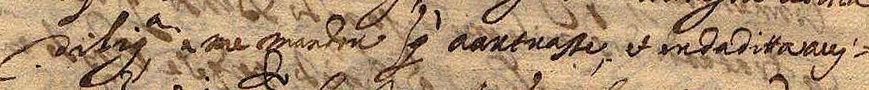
diliga, e me mandou q̄ a autuasse, e eu da ditta acej
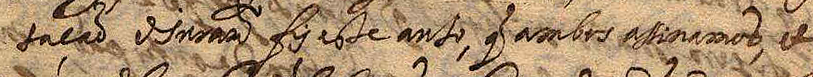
taçaõ e iuramto fis este auto, q̄ ambos assinamos, &
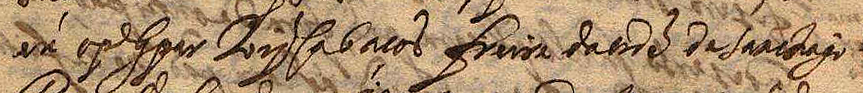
eu o pe Gpar Roiz̄ Cabaços freire da ordē de sanctiago
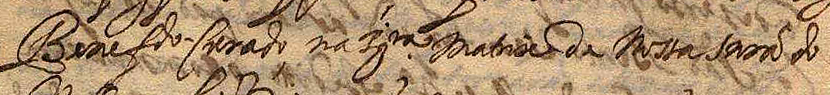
Benefdo. Curado na igra. matrix de Nossa snrā do
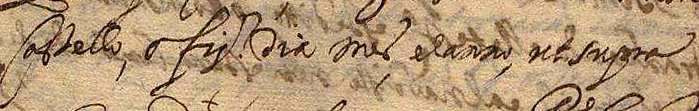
Castello, o fiz dia mes e anno, ut supra
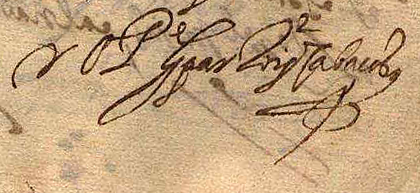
o Pe Gpar Roiz̄ Cabaços
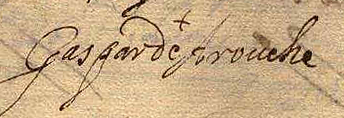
Gaspar de Arouche
